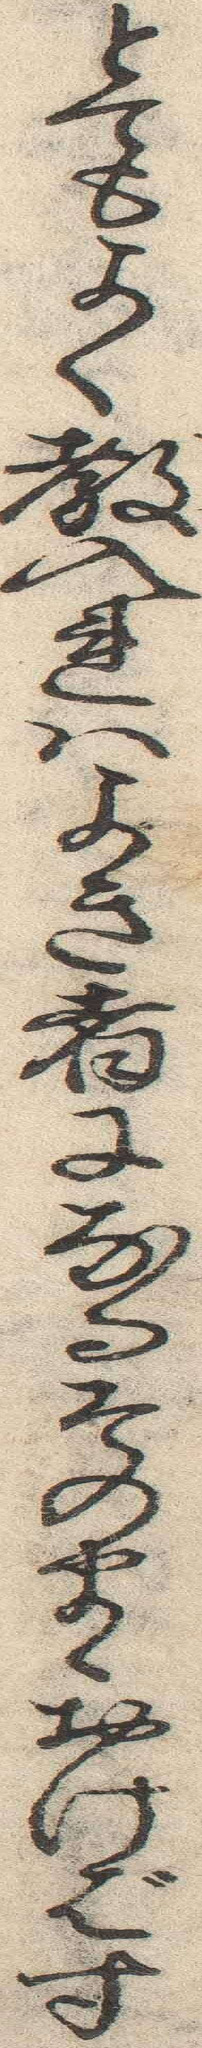とてもよく教入れはよき者になるそのまゝおけばす
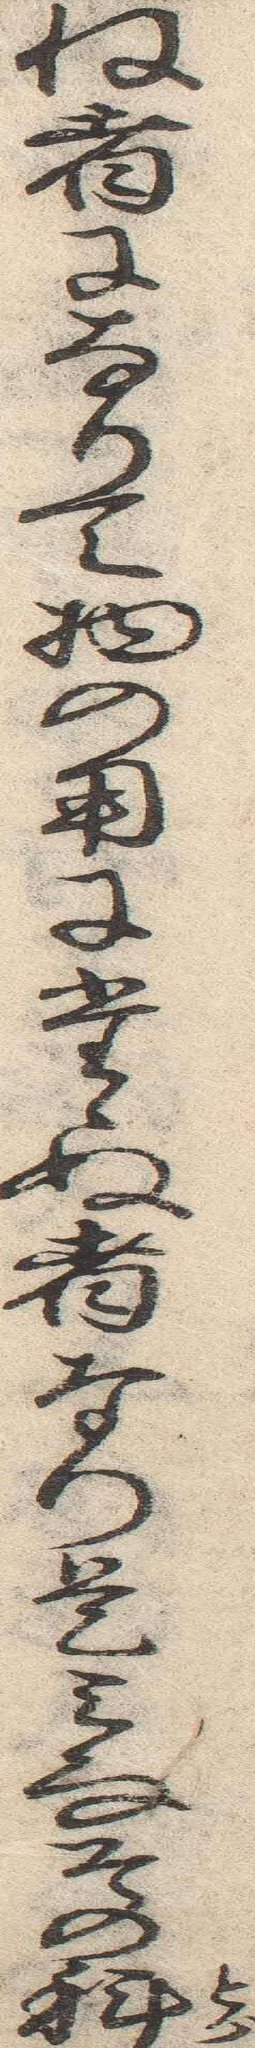ね者になりて物の用にたゝぬ者なり是みなその科
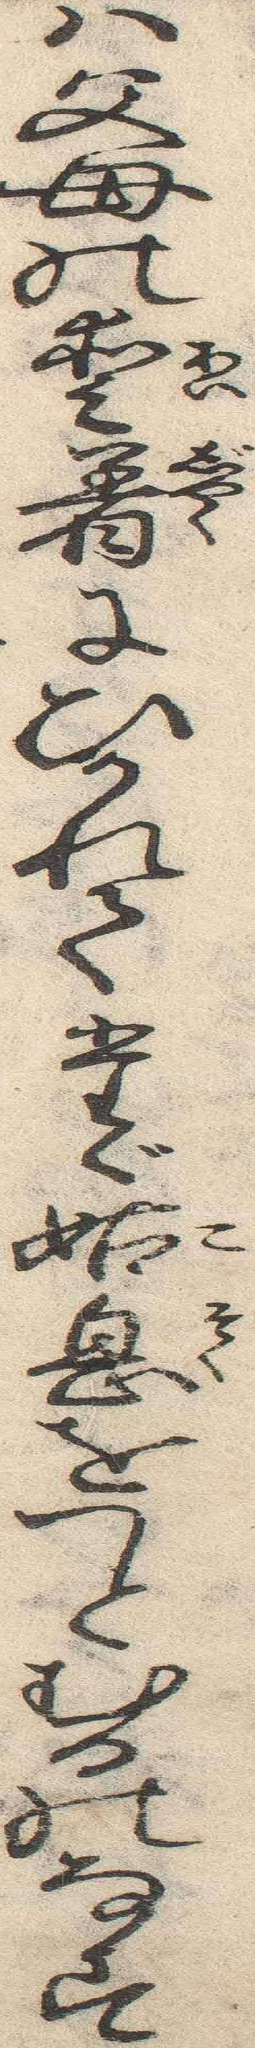は父母の愛着にひかれてたゞ姑息をつとむるのなす
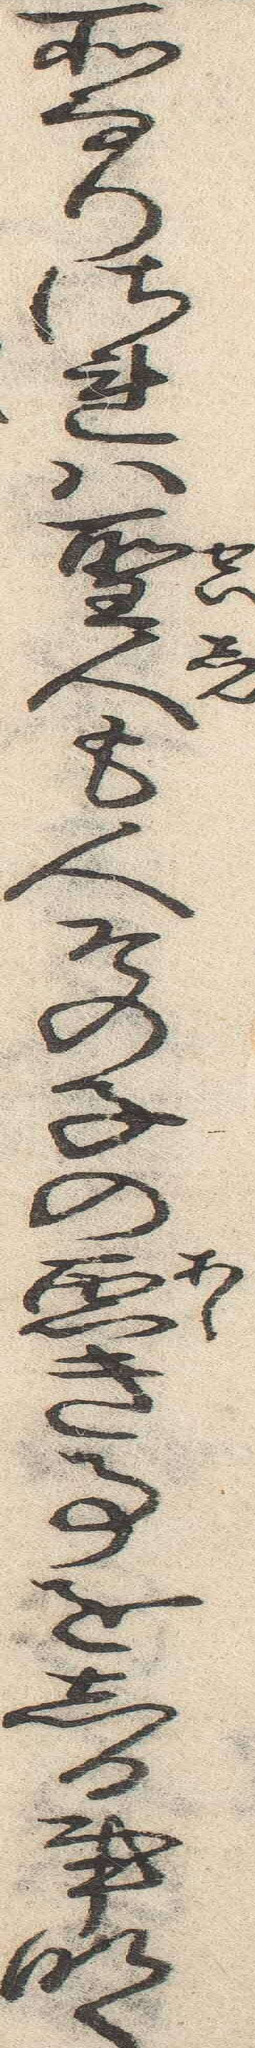所なりされは聖人も人その子の悪き事をしる事なく
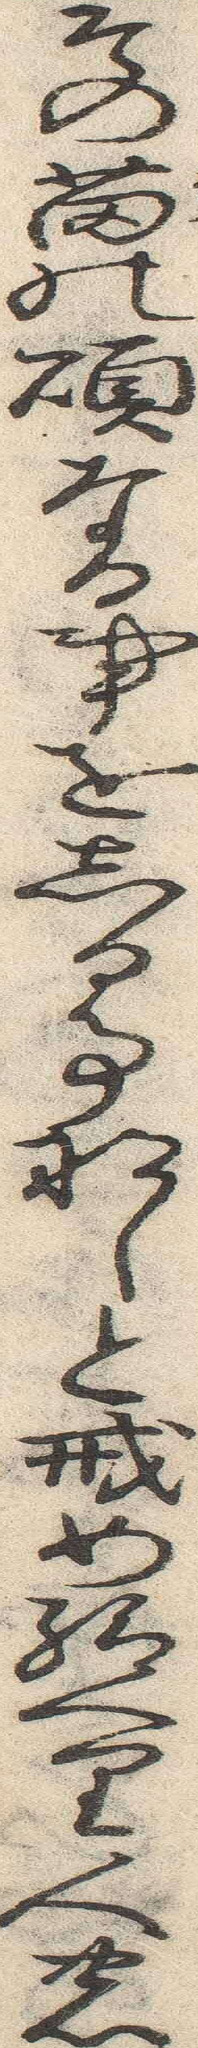その苗の碩なる事をしる事なしと戒め給へり人の
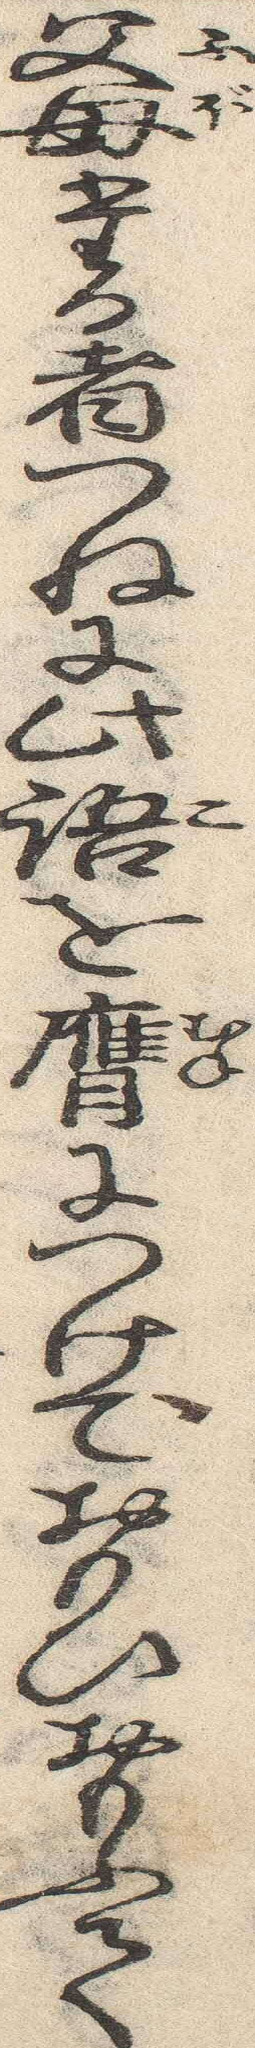父母たる者つねに此語を膺につけておもひおもふて
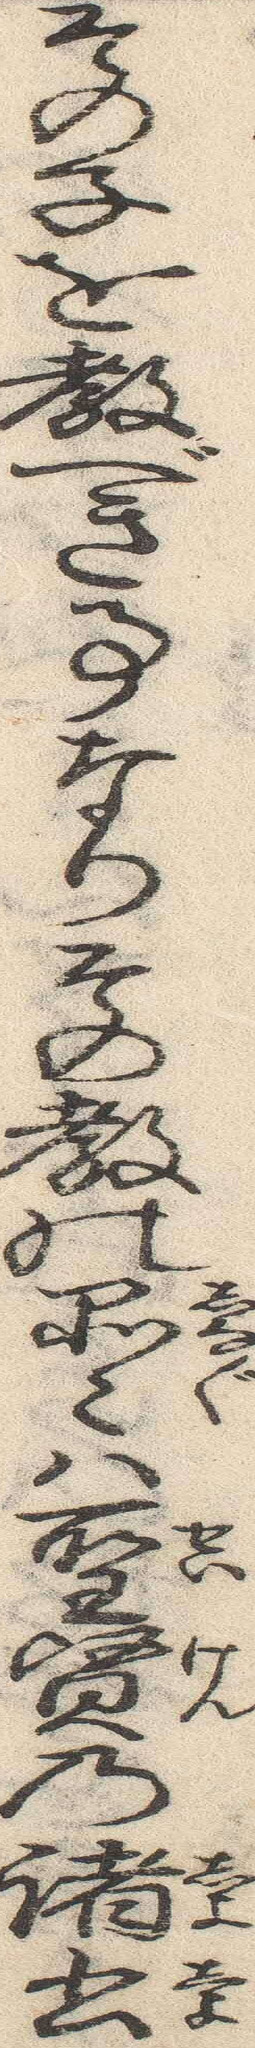その子を教べき事なりその教の品々は聖賢の諸書
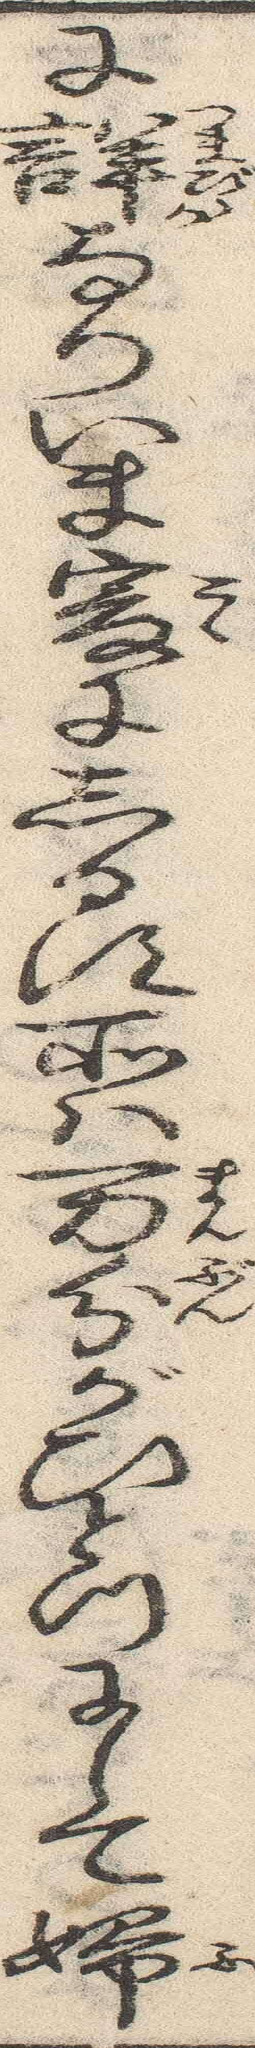に詳なりいま爰にしるす所は万分がひとつにして婦
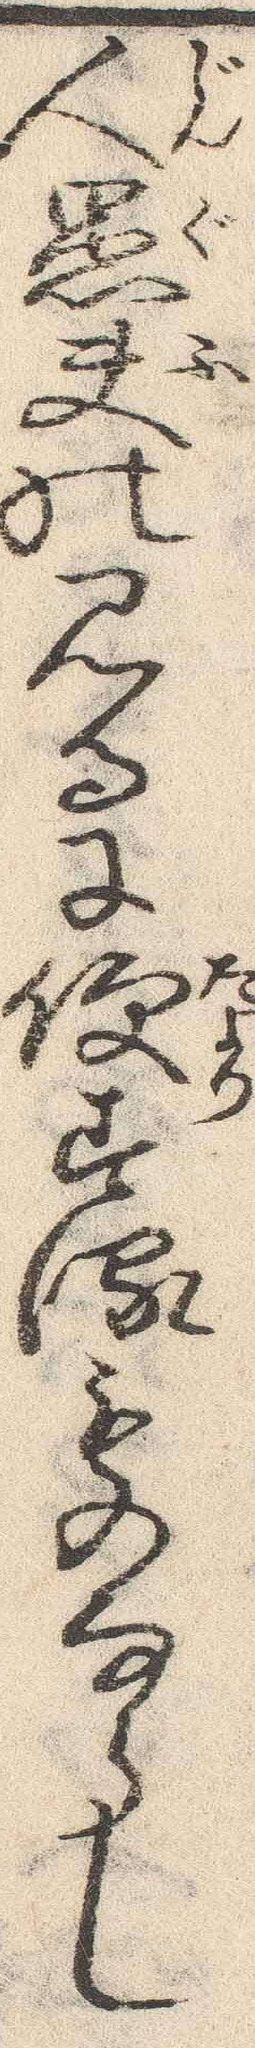人愚夫の見るに便するものならし
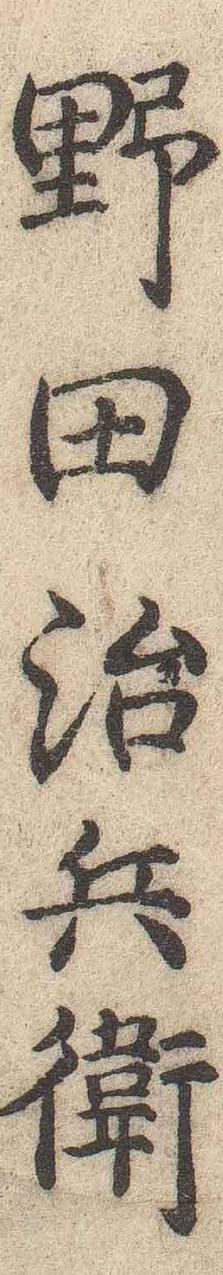野田治兵衛
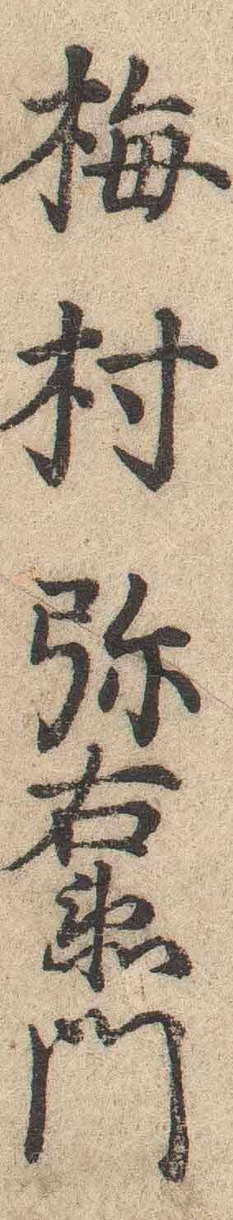梅村弥右衛門
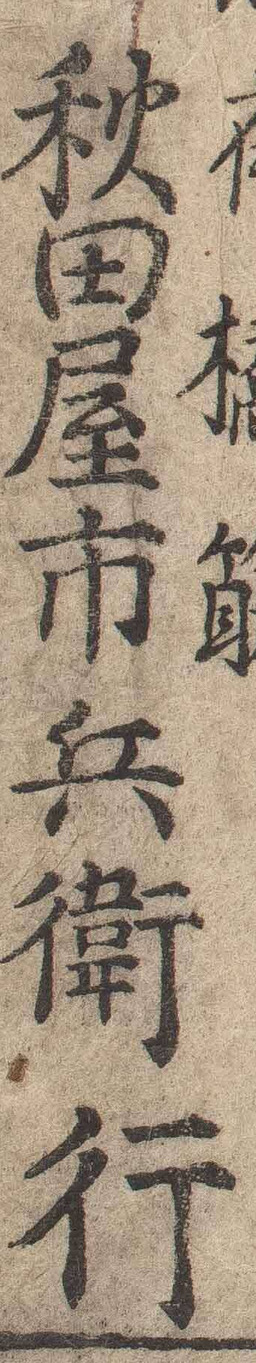秋田屋市兵衛行
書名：小児必用養育草
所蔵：東京学芸大学附属図書館 国文学研究資料館
